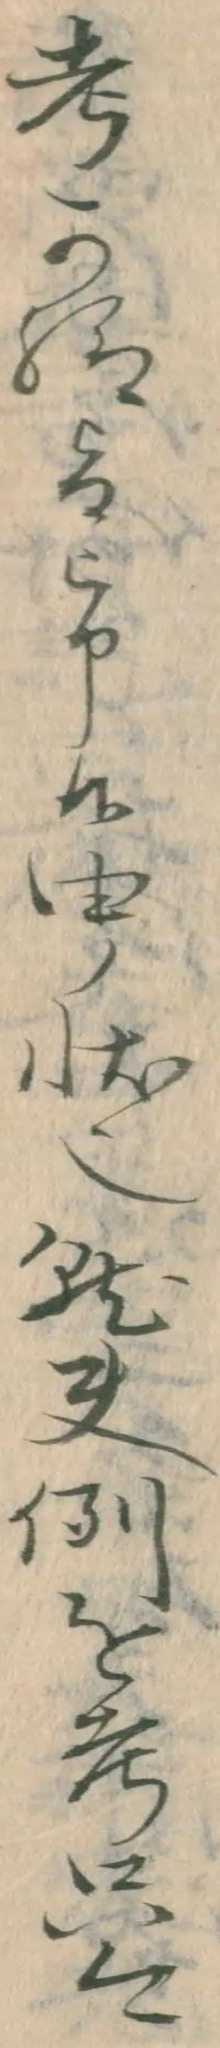考可給旨被申候由ノ状也就夫例を考只今
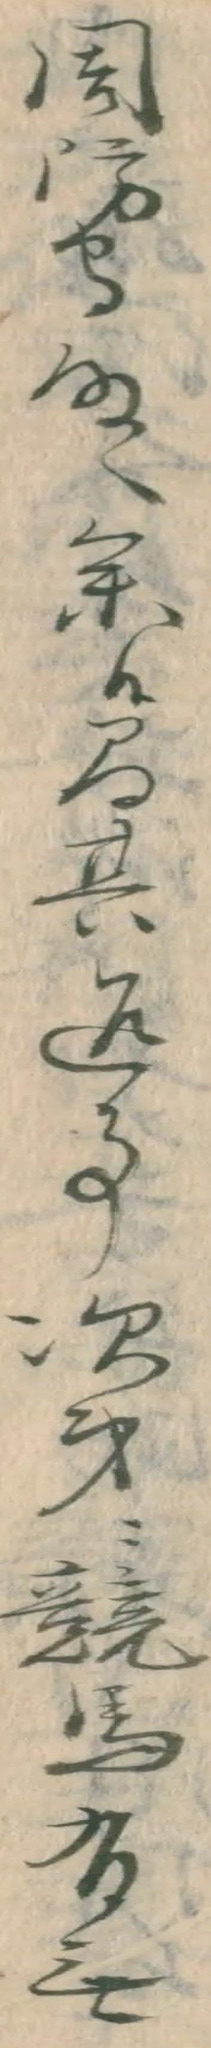周防守殿へ参候間其返事次第ニ競馬有無
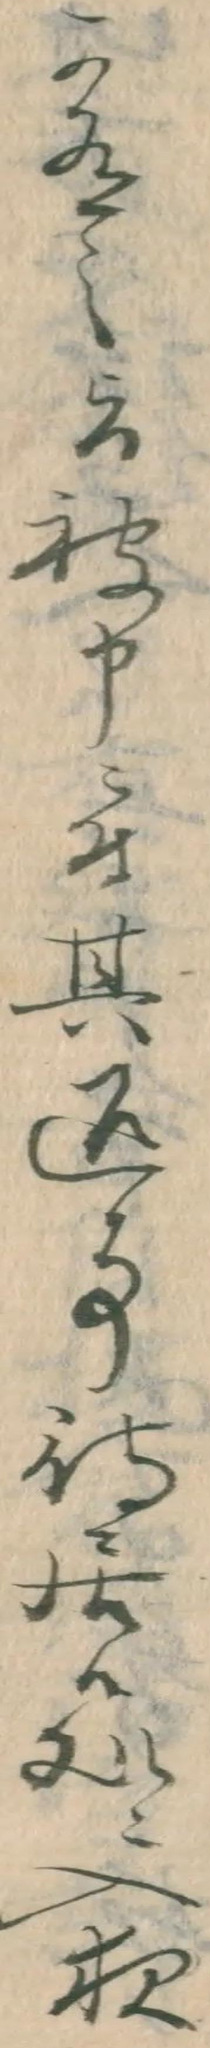可有之旨被申ニ付其返事待居候処ニ入夜
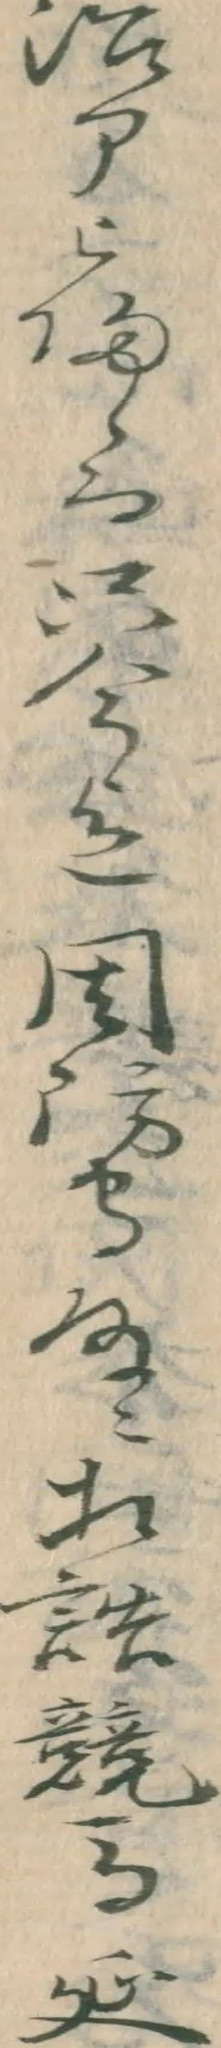治部被帰候而只今迄周防守殿ニ相詰競馬延
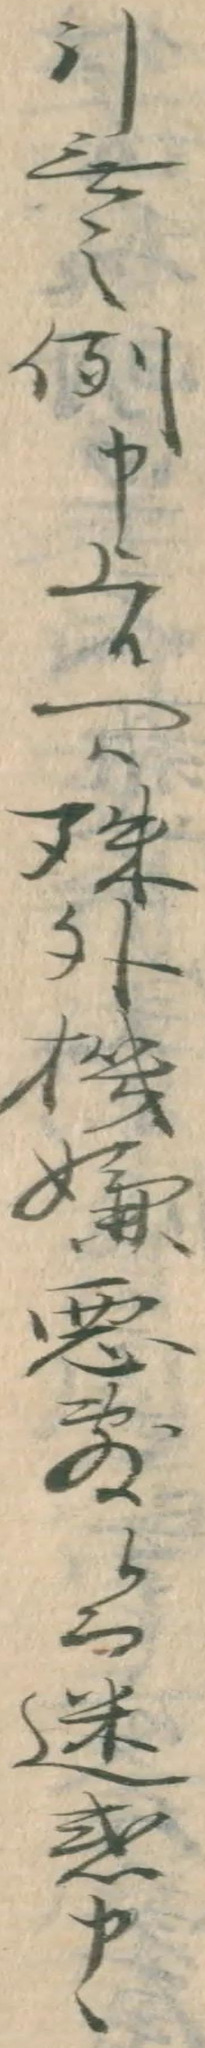引無之例申上候へハ殊外機嫌悪敷ニ而迷惑申候
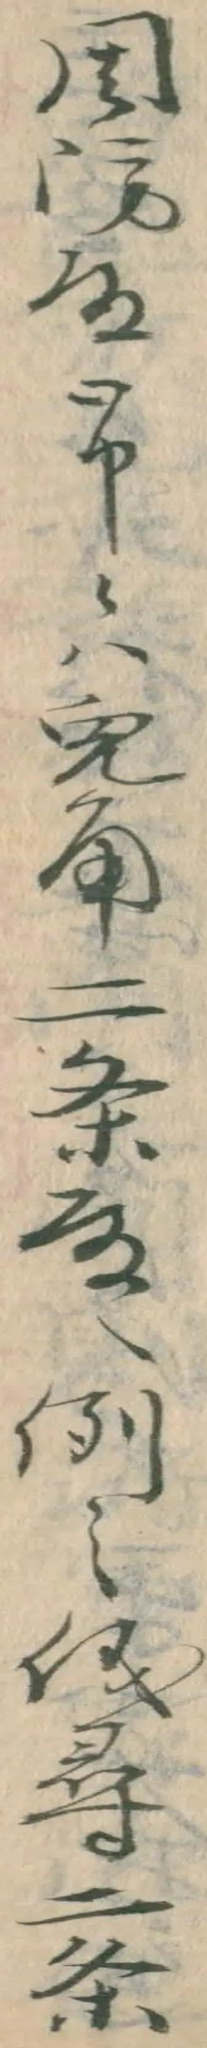周防殿御申候ハ兎角二条殿へ例之儀尋二条
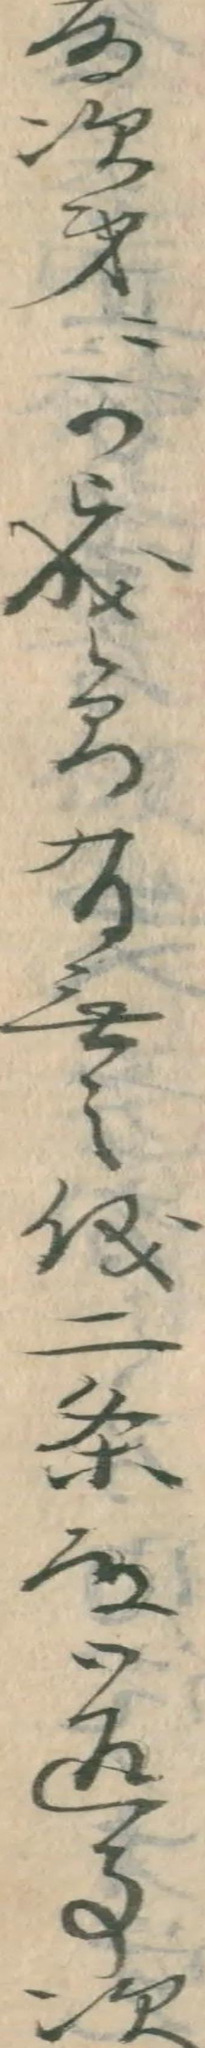殿次第ニ可被成候間有無之儀二条殿御返事次
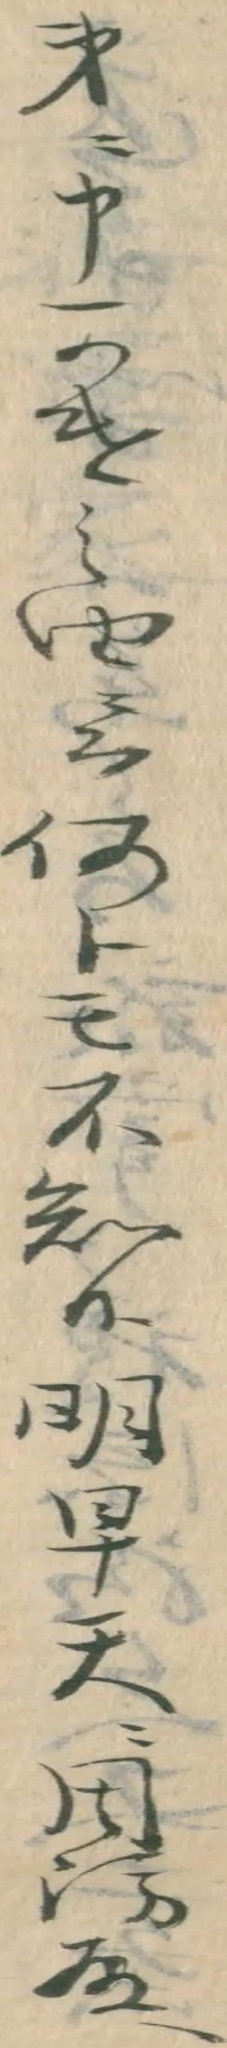弟ニ申可遣之由ニ而何トモ不知候明早天ニ周防殿へ

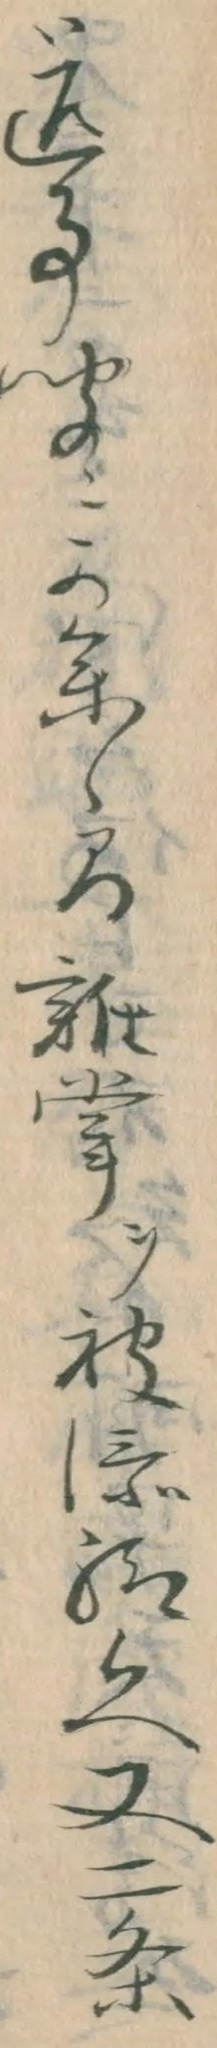御返事聞ニ可参候間雑掌ヲ被添給候へ又二条
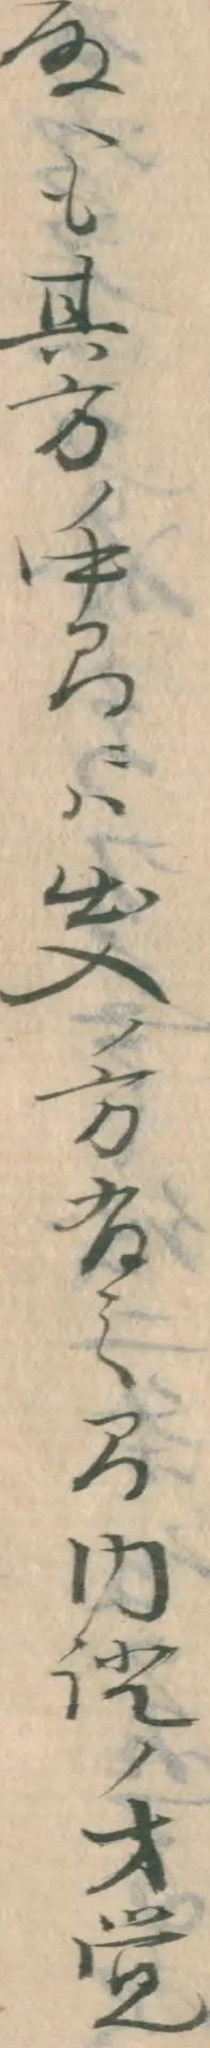殿へも其方ノ中間ニハ出入ノ方有之間内證ノ才覚
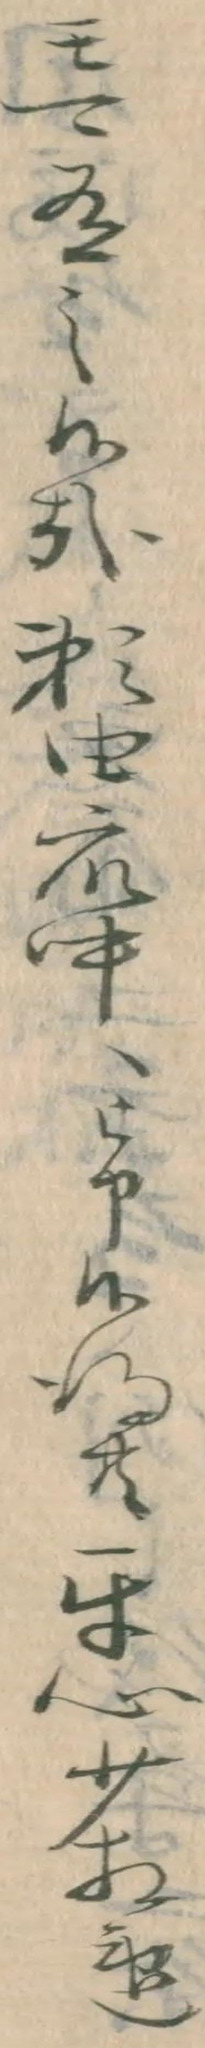モ可有之候哉頼由衆中へ被申候得共互心少相違
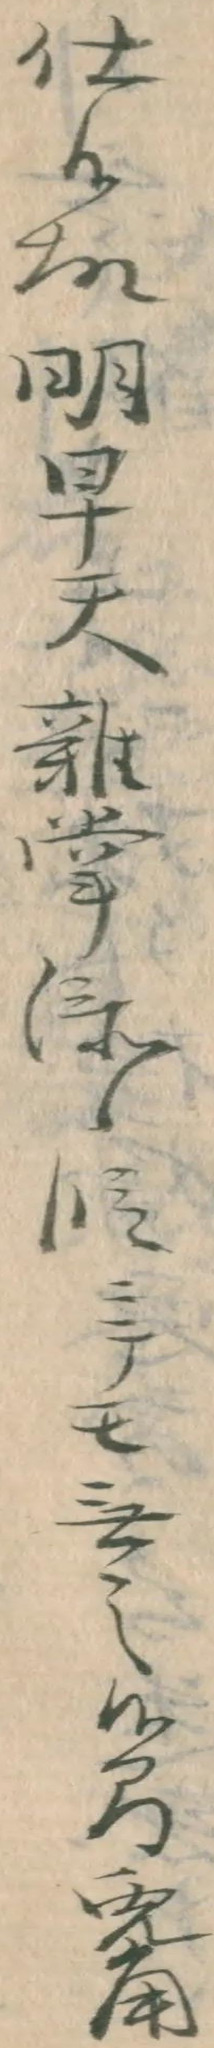仕候故明早天雑掌添候段ニテモ無之候間兎角
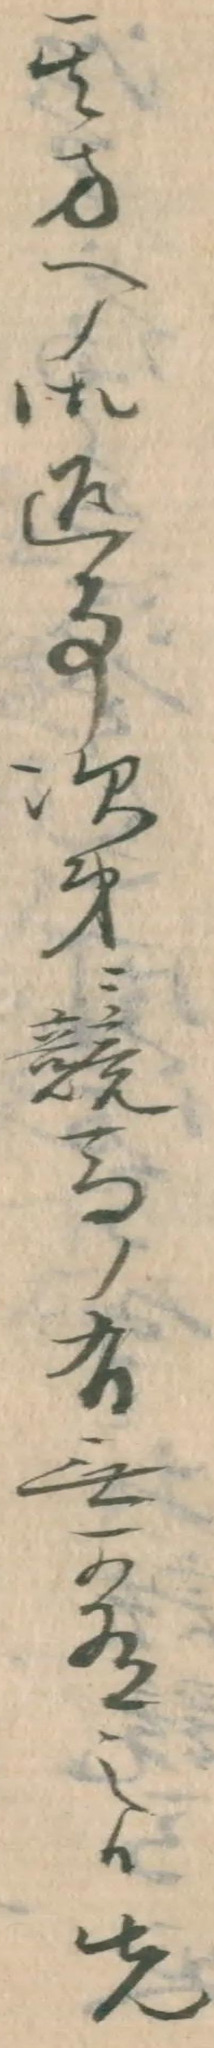其方へノ御返事次第ニ競馬ノ有無可有之候先
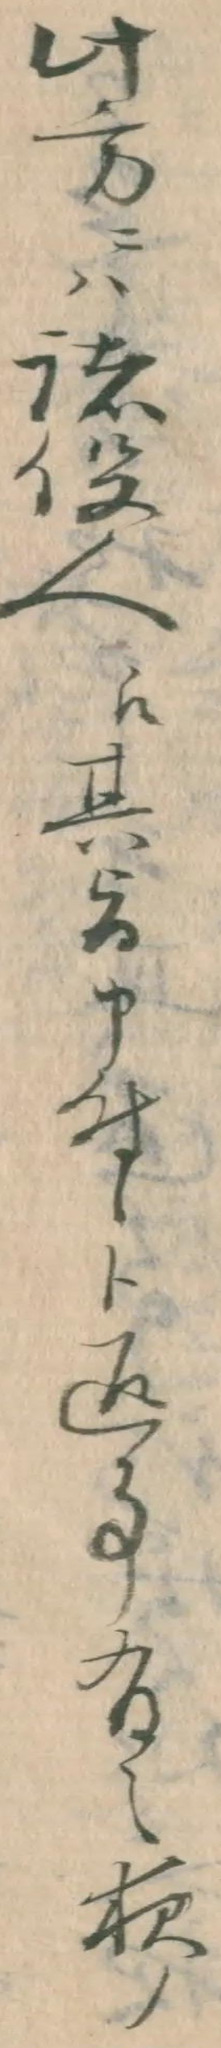此方ニハ諸役人江其旨申付候ト返事有之夜ノ
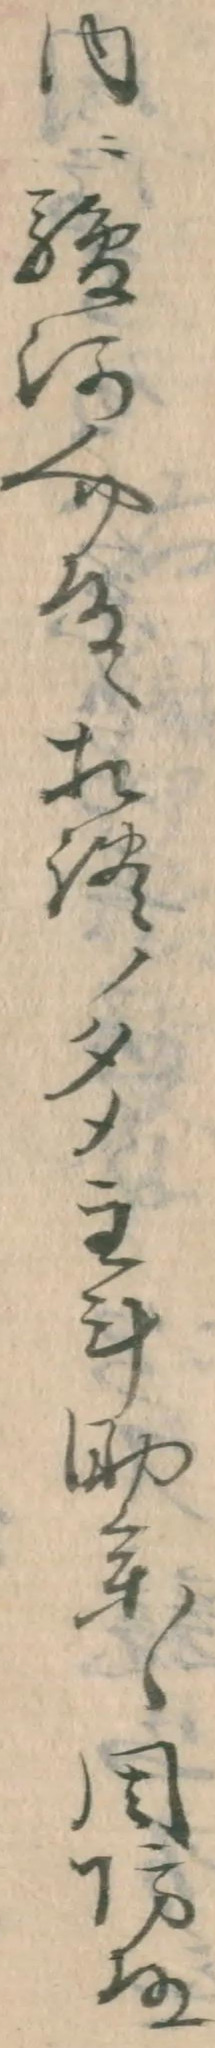内ニ駿河介殿へ相談ノタメ主計助参候周防殿
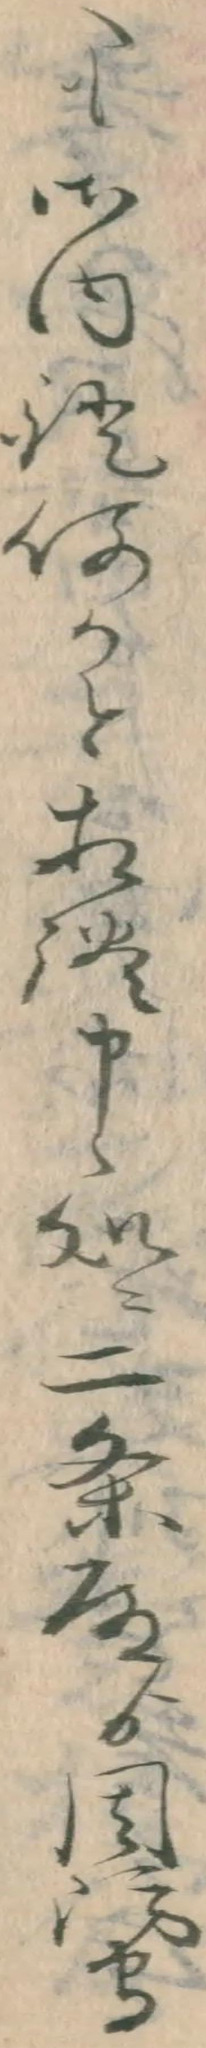へも御内証何かと相談申候処ニ二条殿ゟ周防守
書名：賀茂社記録. 第10冊
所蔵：国立国会図書館 National Diet Library, JAPAN
